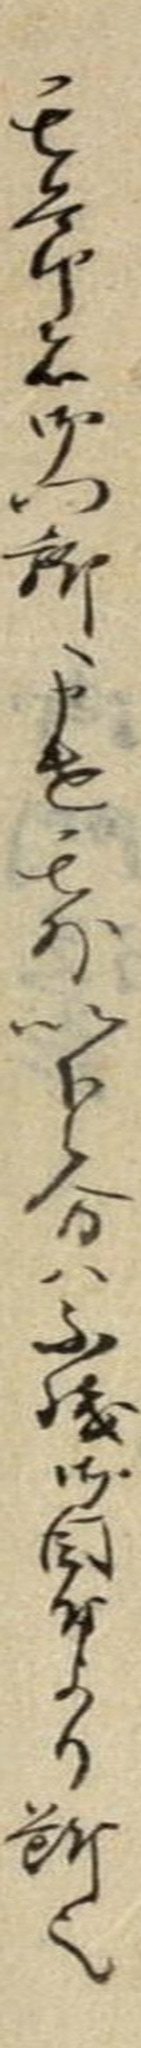其節は御門所へ申遣其外以下之分は不残御目付より断之
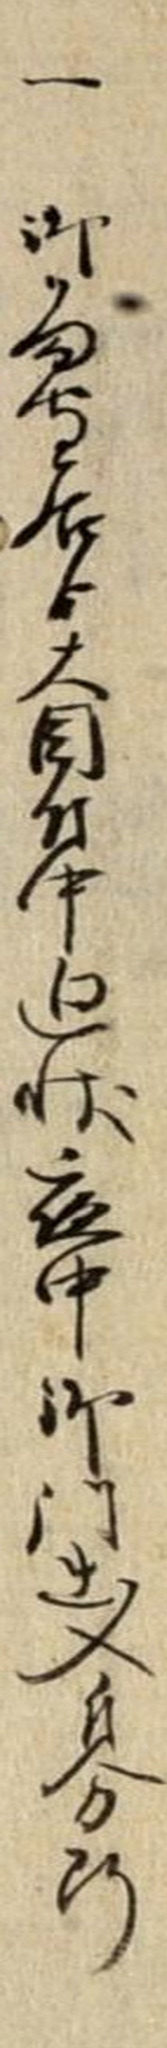一御留守居ゟ大目付中廻状夜中御門出入自分断
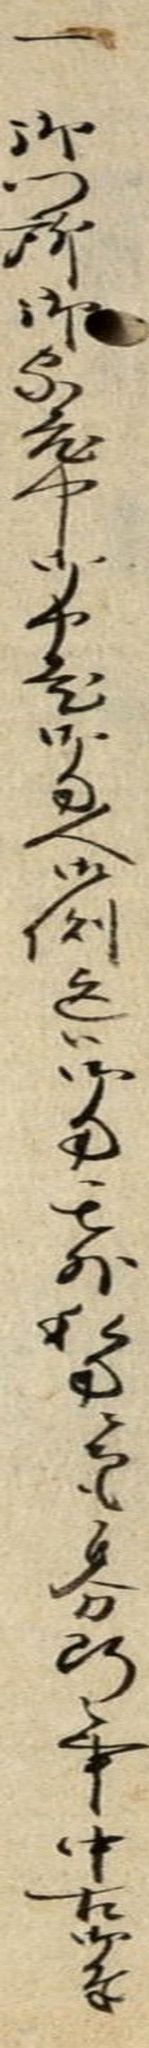一御門所御家老中御中老御用人御側迄は御用其外私用にても自分断之事中古御奉
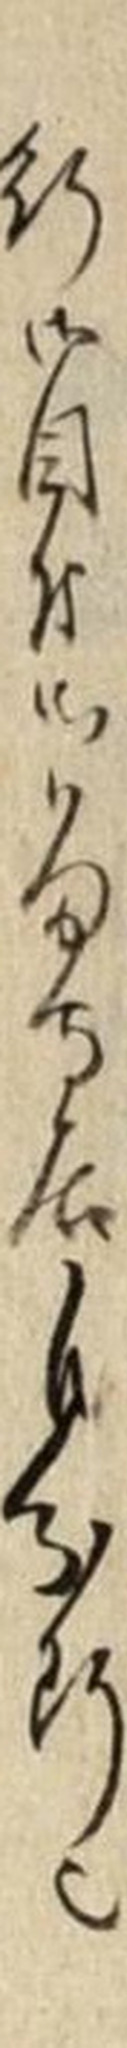行御目付御留守居自分断也
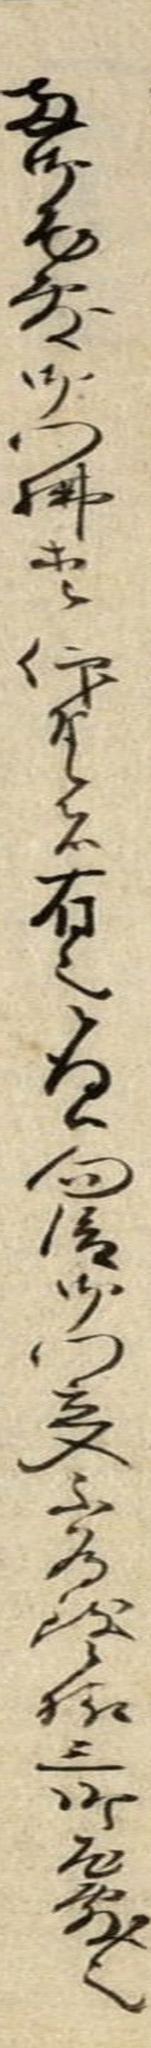一両御屋敷御門払等被仰付候者有之候得は向後御門立入不為致候様三御屋敷之
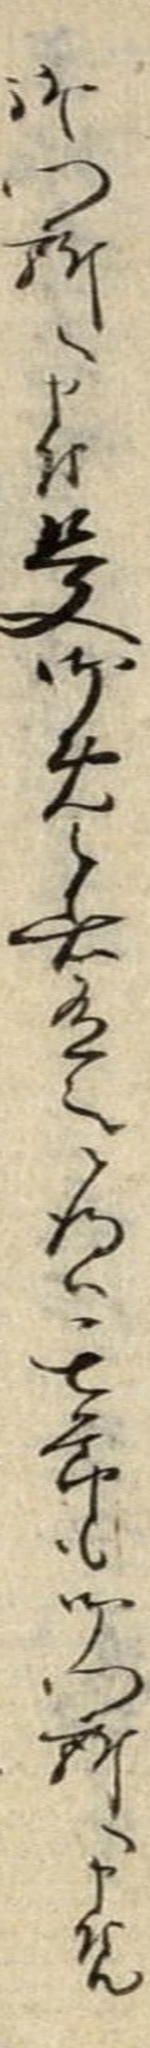御門所へ申付且又御免之者有之候得は其節も御門所へ申付る
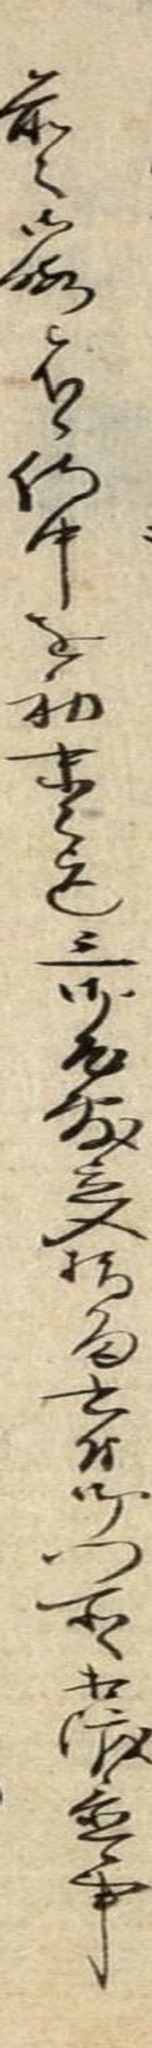一前々御暇被下候侍中を初末々迄三御屋敷立入指留書付御門所へ相渡置候事
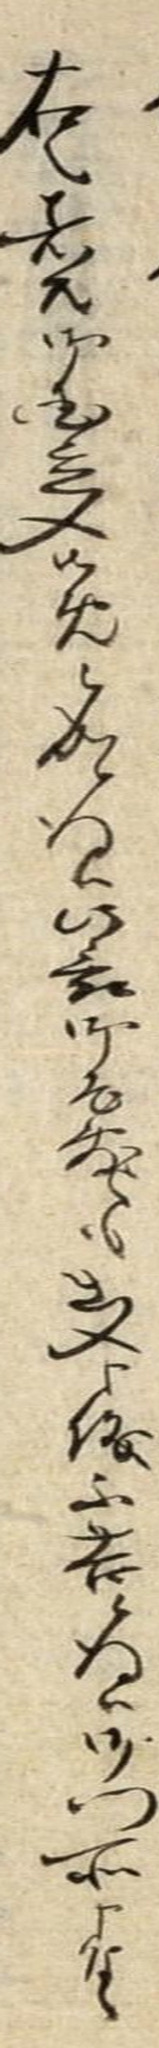右之者共御国立入御免被成候得は此節御屋敷へも出入申儀不苦候得は御門所申付之
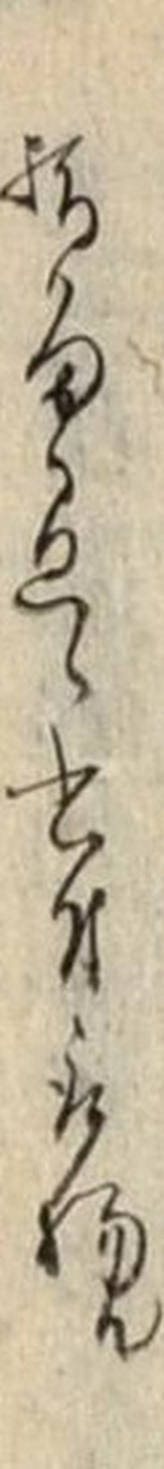指留置候書付取揚る
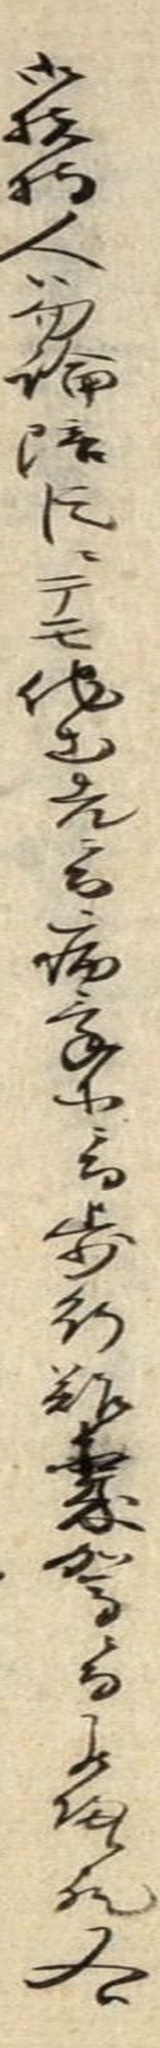一御扶持人は勿論陪臣にても他出先にて病気等にて歩行難相成駕にて罷帰候欤又は
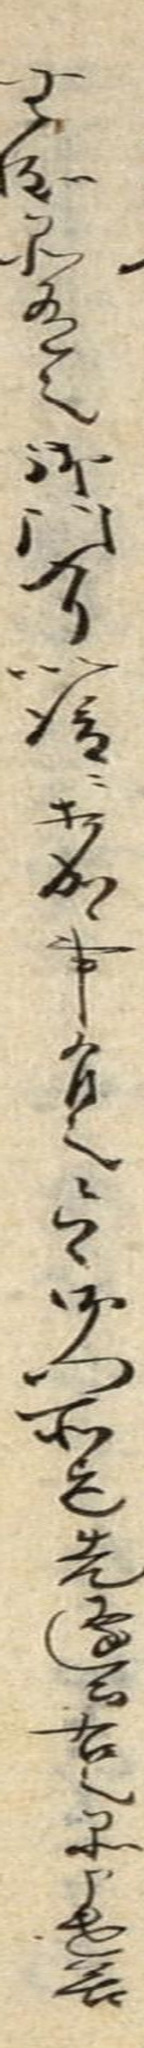無據品有之御門〆り以後に相成候事有之候はゝ御門所迄先達て右之品申遣筈
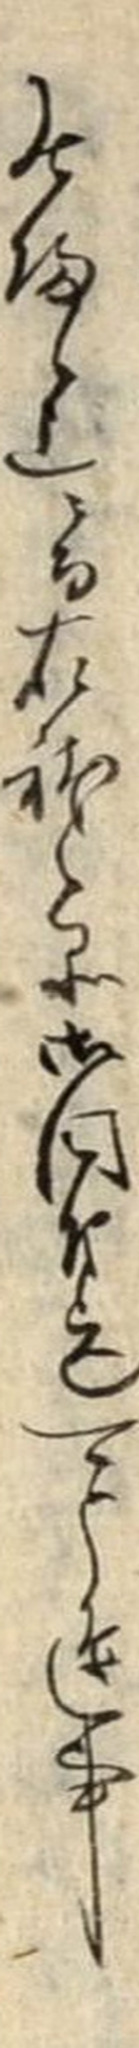罷帰候上にて右体之品御目付迄可申達事
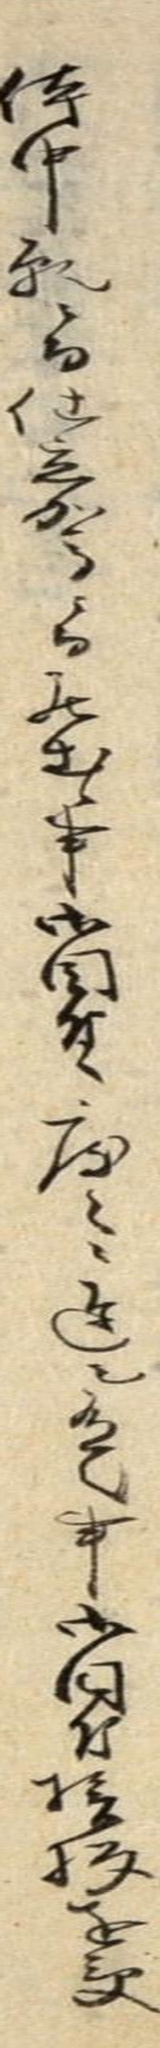一侍中願にて仕立駕にて罷出候事御目付へ度々に達し有之事御目付挨拶を受

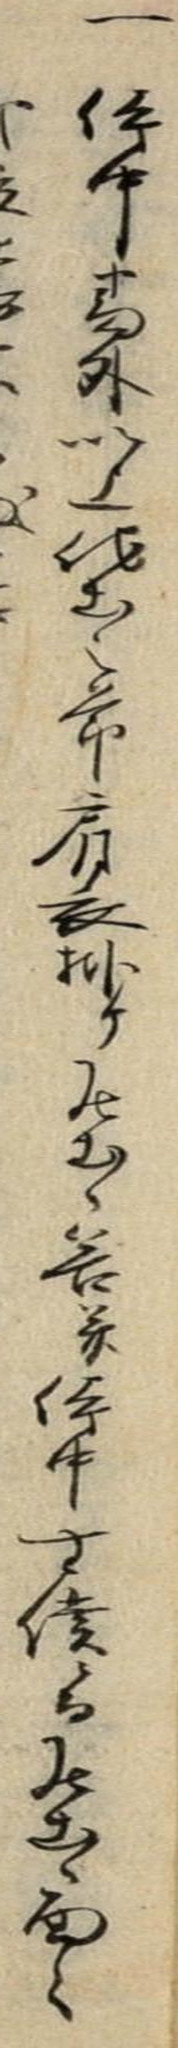一侍中番外以上他出之節肩衣掛け罷出候筈幷侍中無僕にて罷出候面々
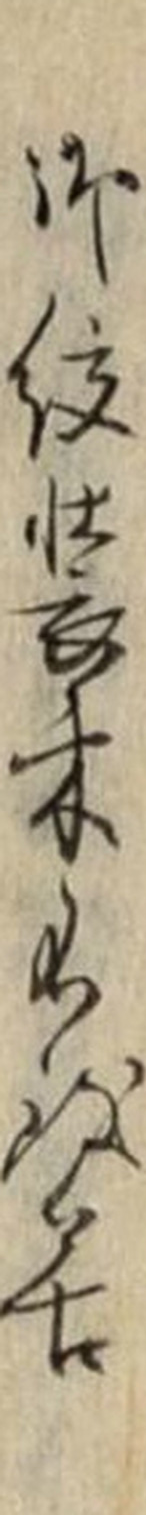御紋装束不致筈
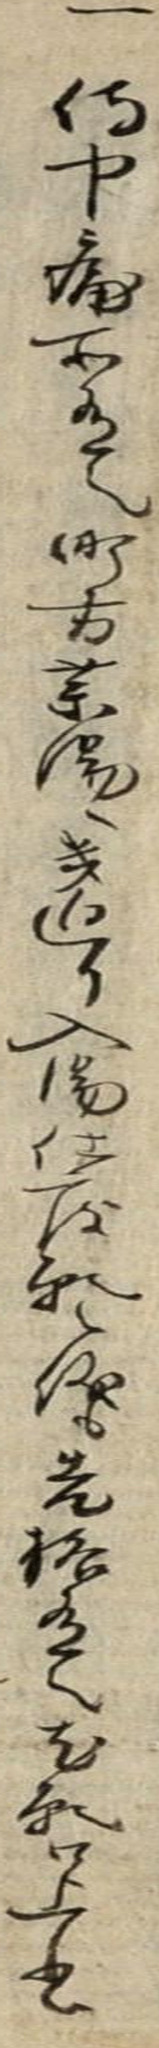一侍中痛所有之町方薬湯へ幾廻り入湯仕度願之儀も先格有之尤願口上書
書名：三都并道中之部
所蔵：福井県文書館 Fukui Prefectural Archives
